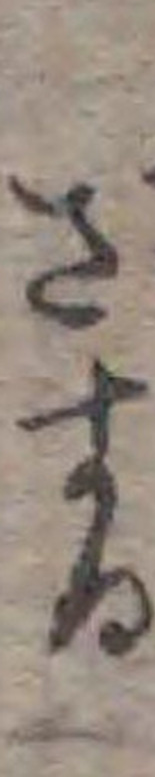さする
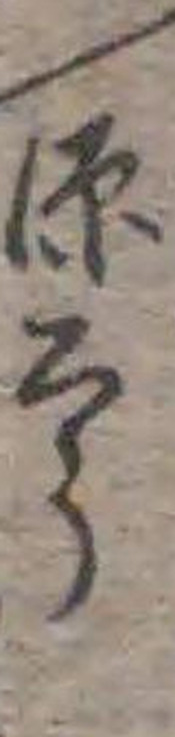源太郎
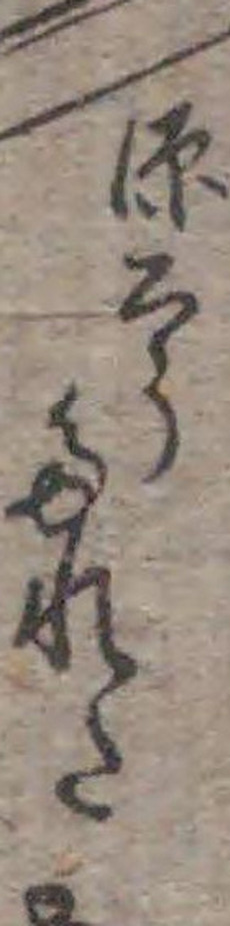たれた

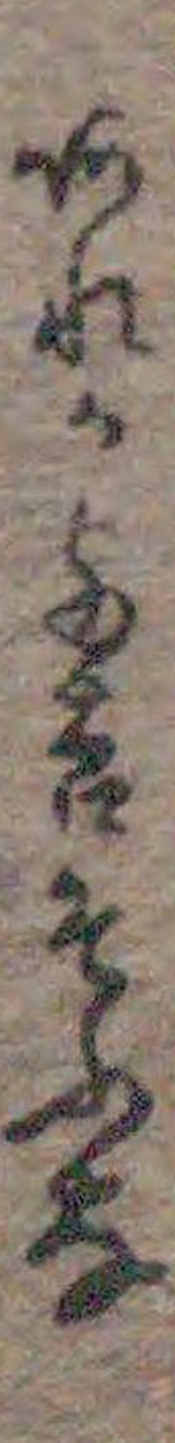あれか与吉そふな
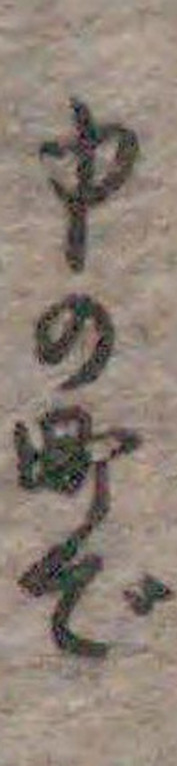中の町で
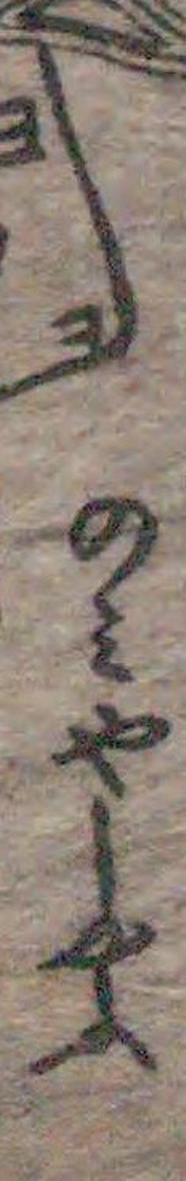のみやしやふ
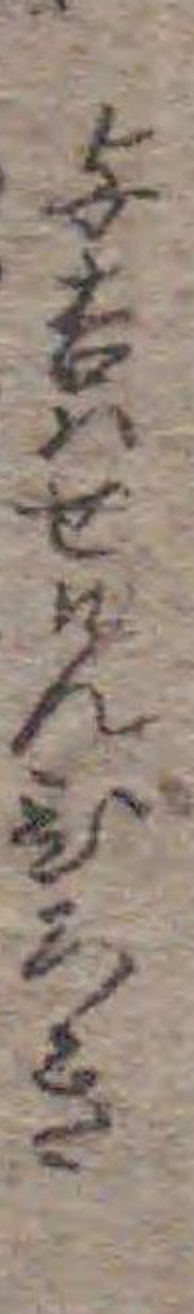与吉はせけんひろき
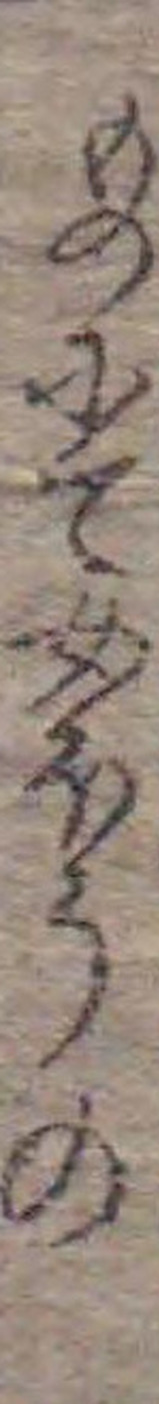ものにて女ほうの
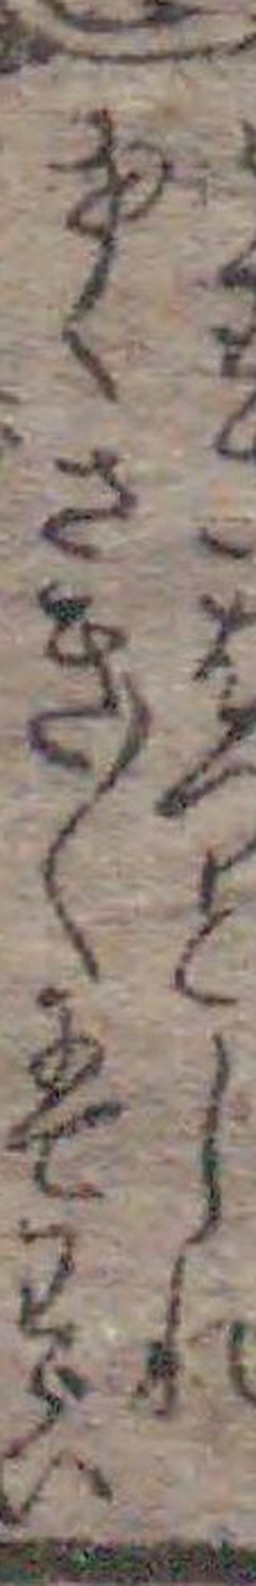ゆくさき〳〵にてわらい
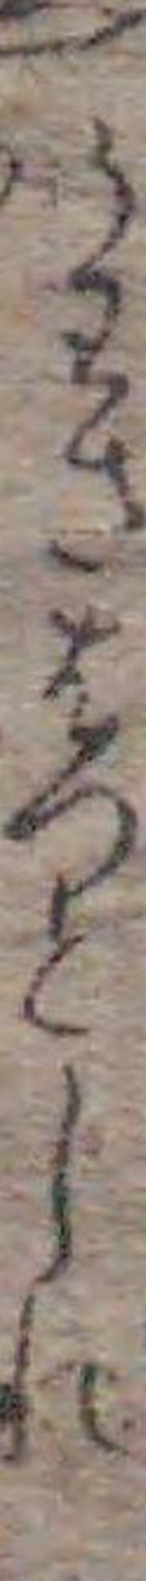うわさはつとしれ
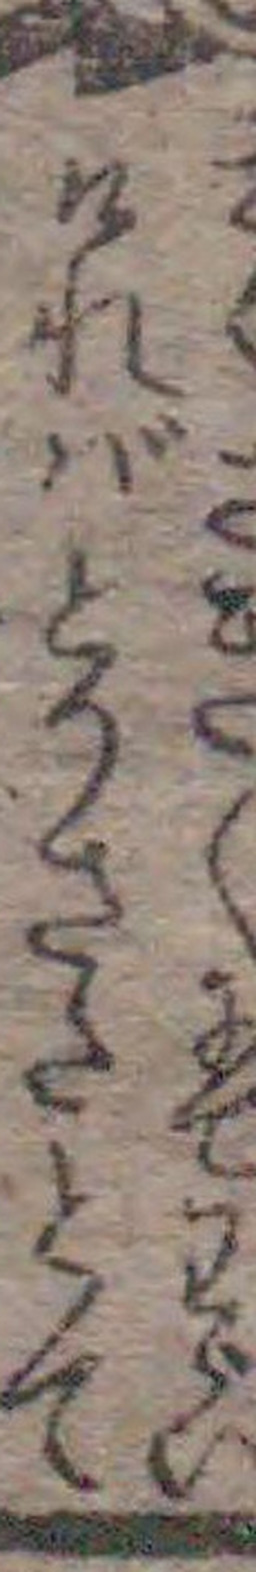ければとりさたとて
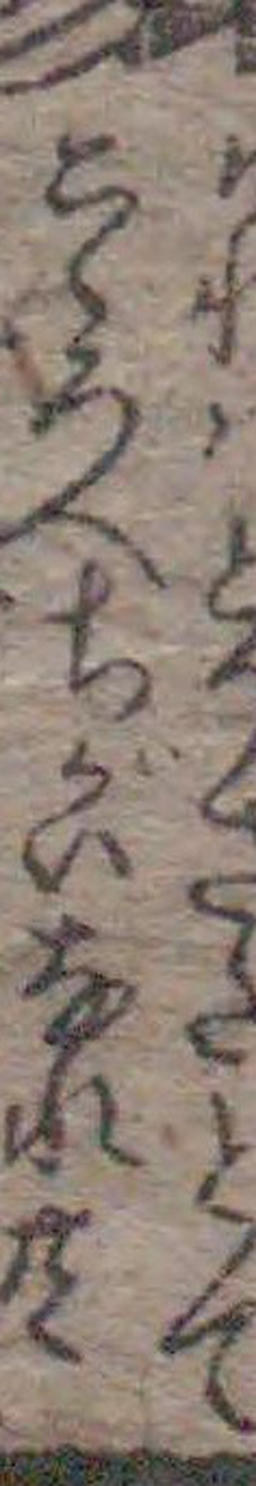こゝろへちがいなれ共
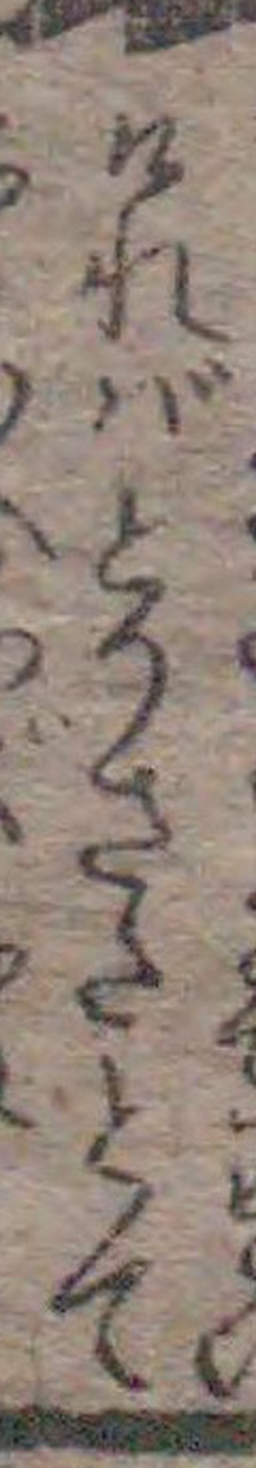ければとりさたとて
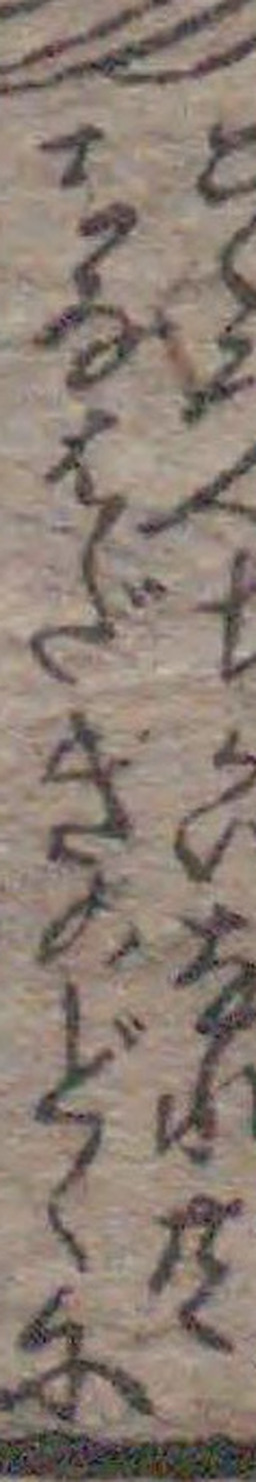はなはだきのどくに
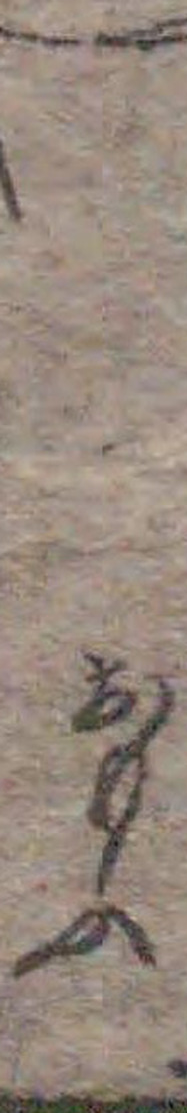おもふ
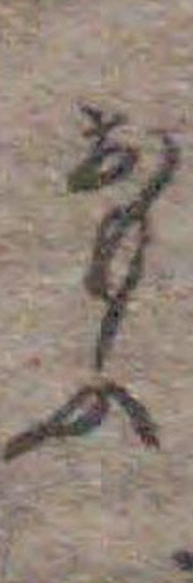おもふ
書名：神田与吉一代記 : 3巻
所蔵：国立国会図書館 National Diet Library, JAPAN
